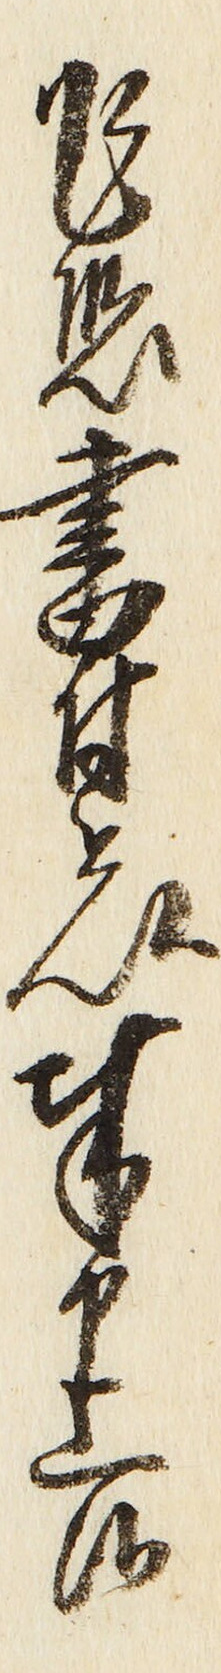乍恐書付を以奉申上候
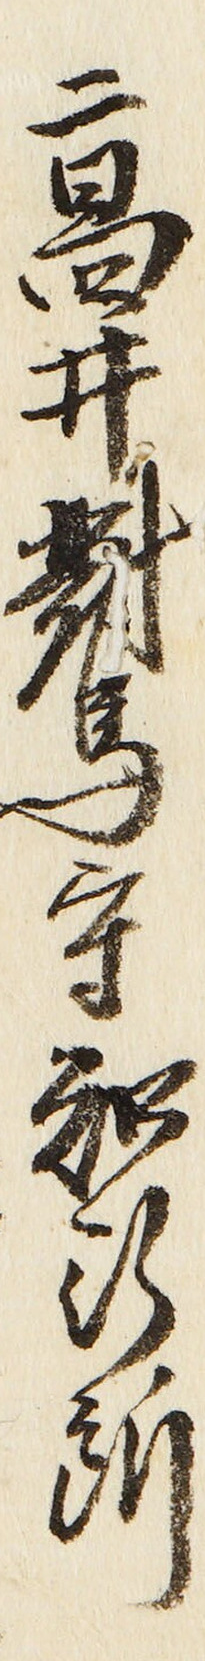高井対馬守知行所
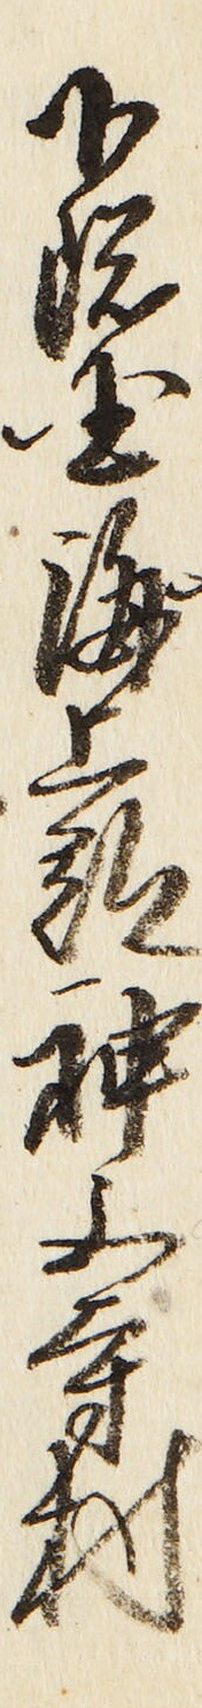下総国海上郡神宮寺村
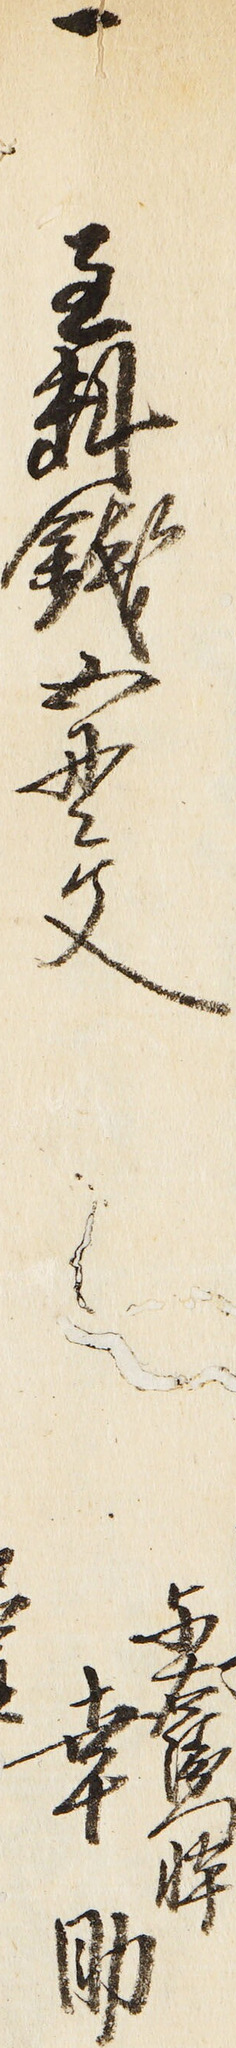一過料銭五貫文幸助
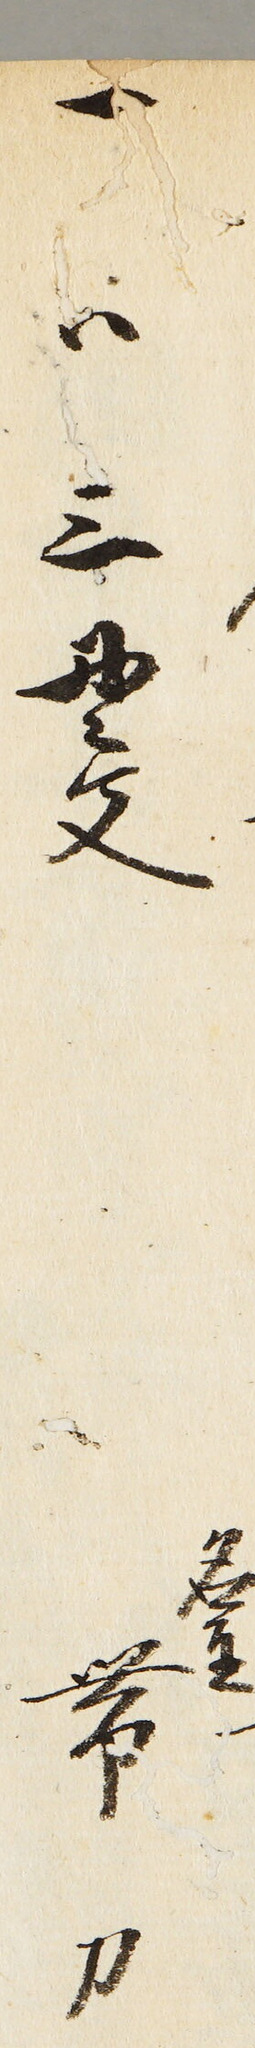一同三貫文帯刀
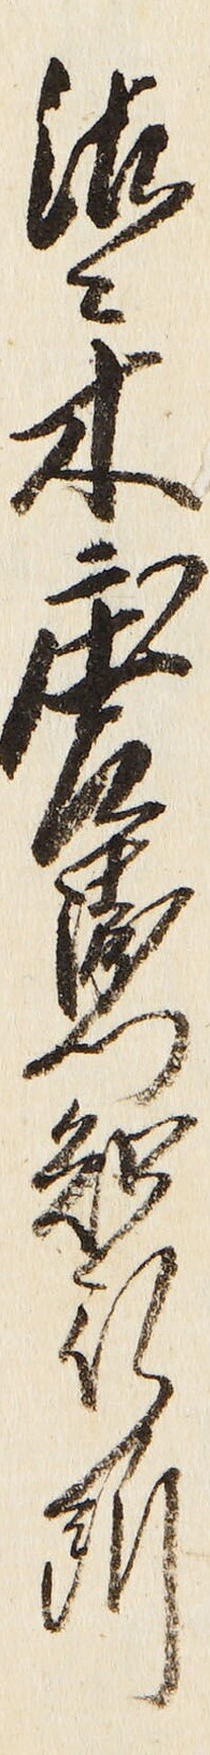佐々木庄左衛門知行所
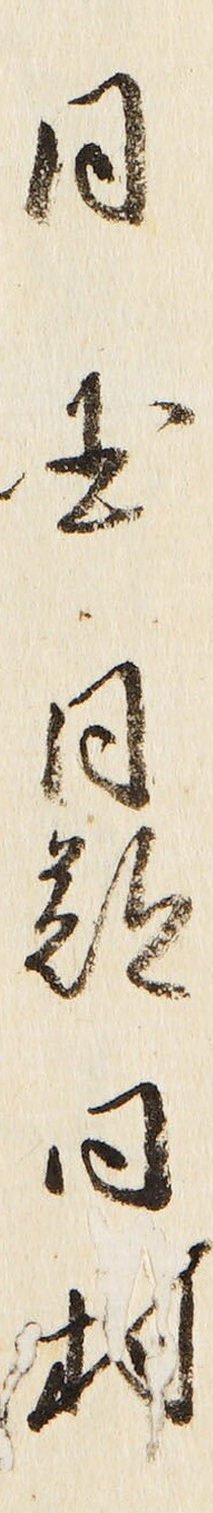同国同郡同村
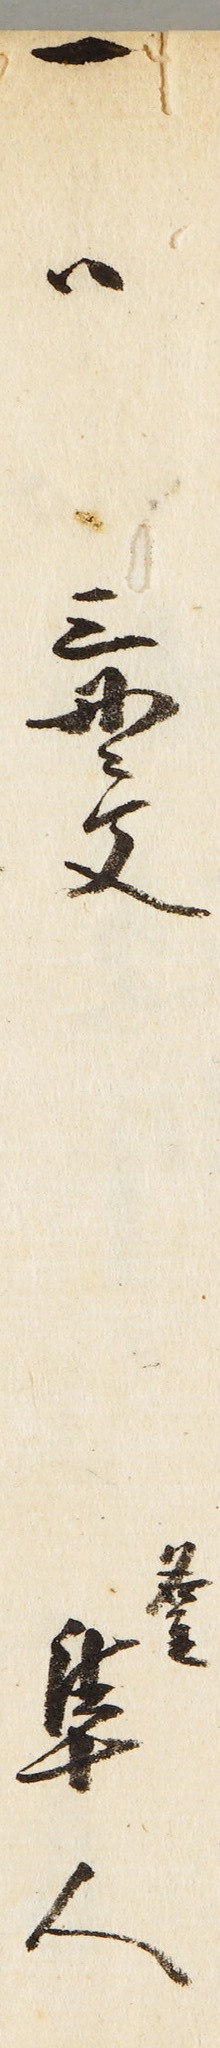一同三貫文隼人
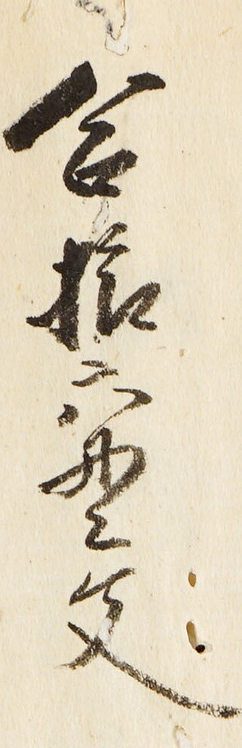合拾六貫文
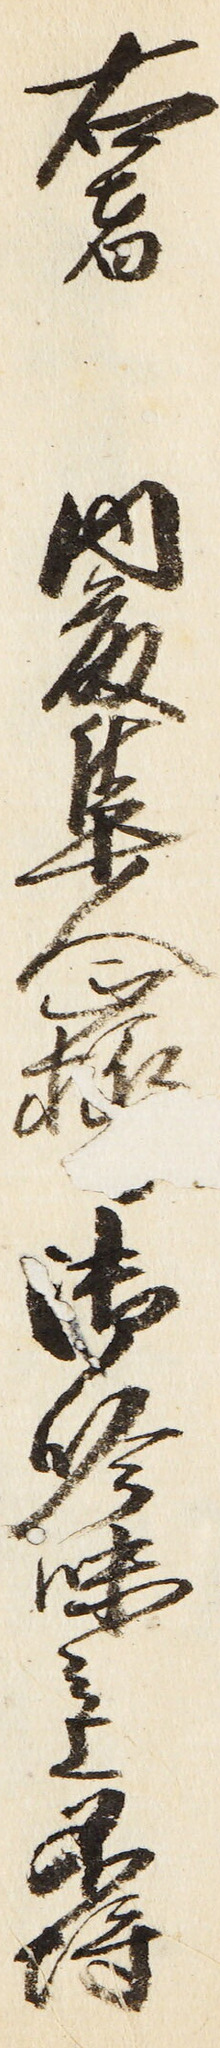右者内藤隼人正様御吟味之上不得
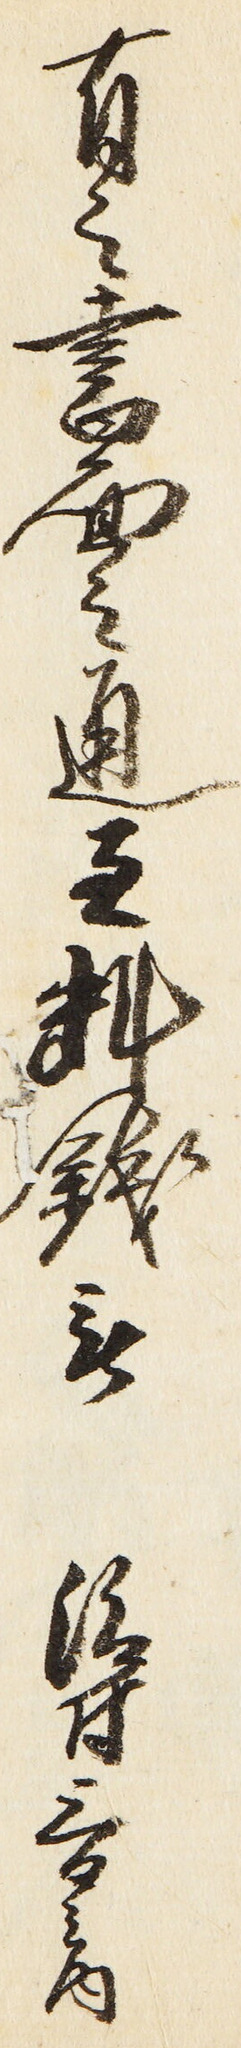有之書面之通過料銭被仰付三日之内
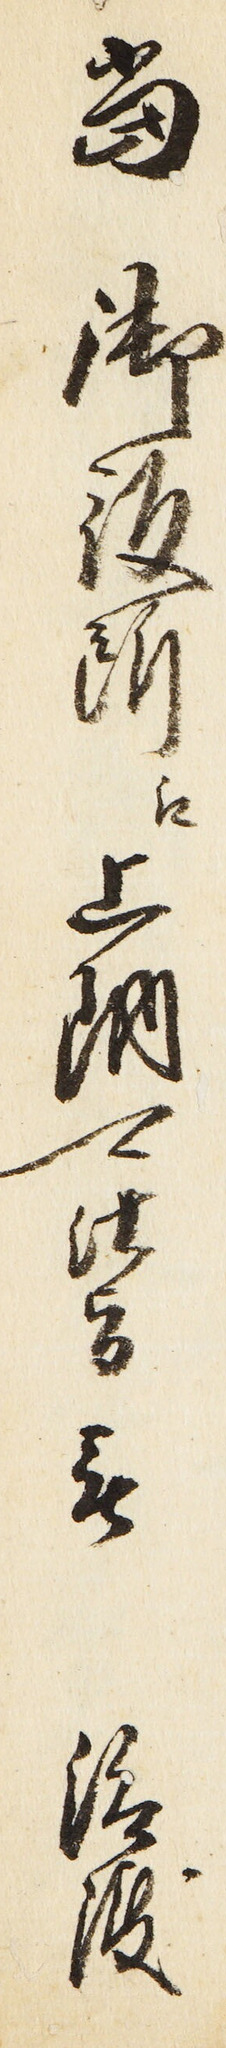当御役所江上納可仕旨被仰渡

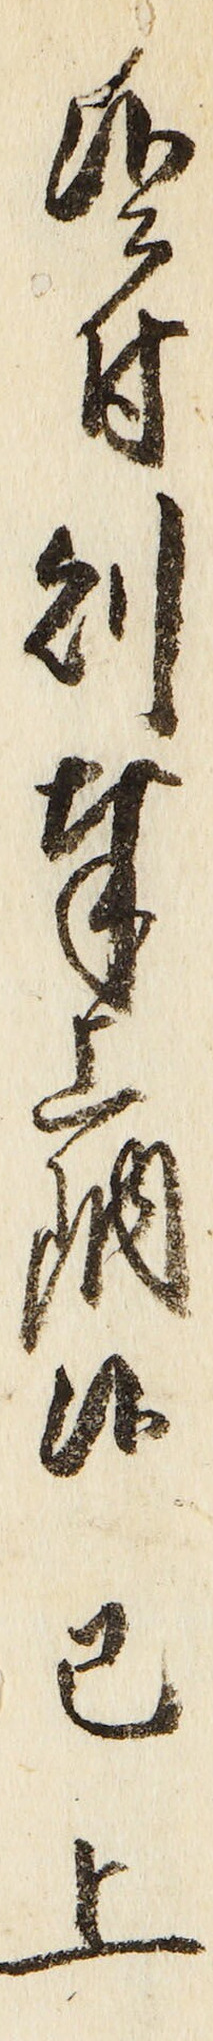候ニ付則奉上納候已上
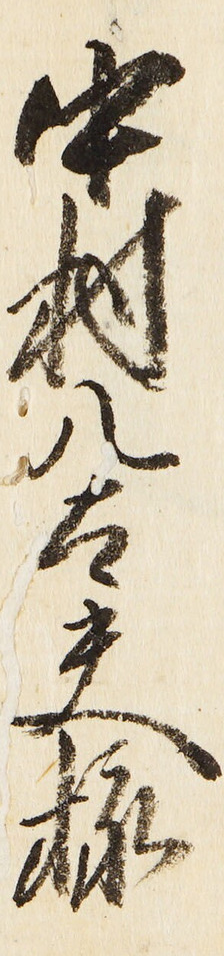中村八太夫様
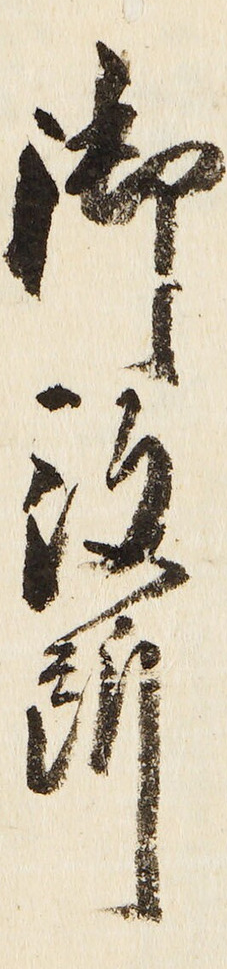御役所
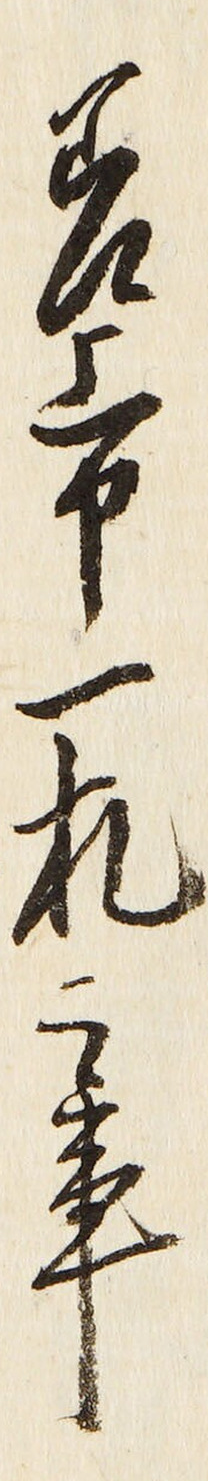差上申一札之事
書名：難船一件記録
